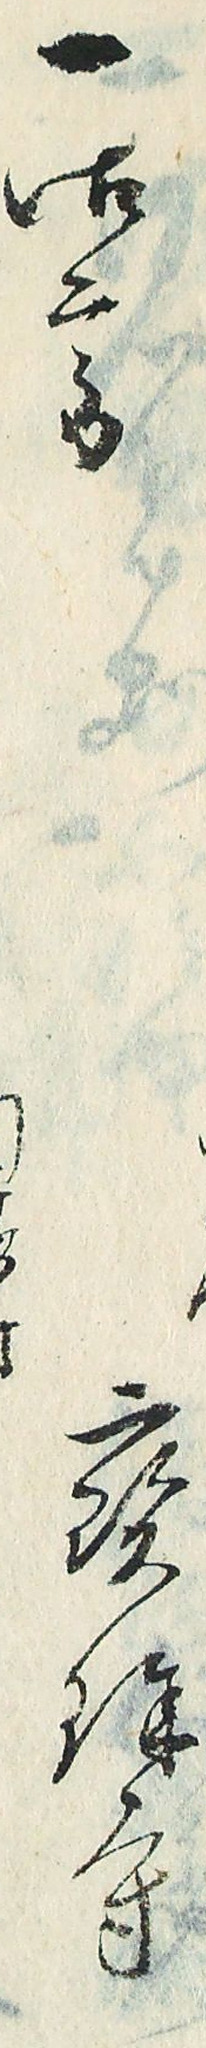一御二方宝珠寺
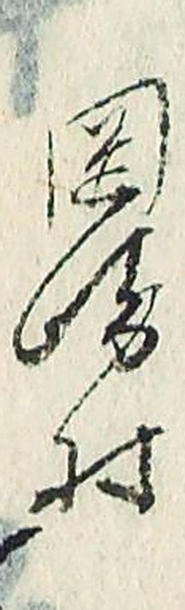岡崎村
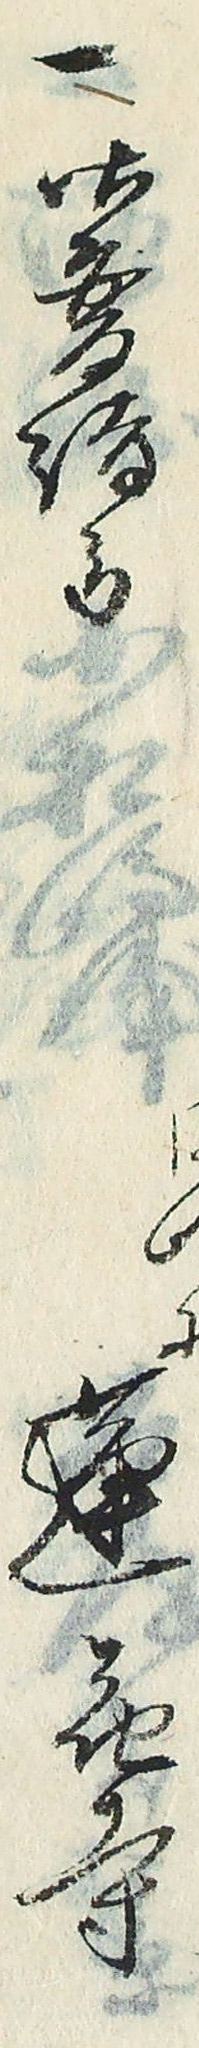一御普請方蓮花寺
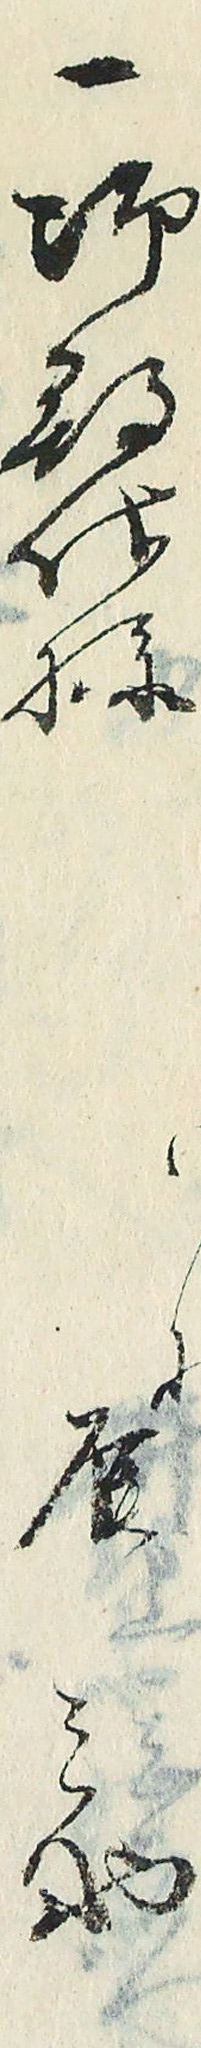一御郡代様辰之助
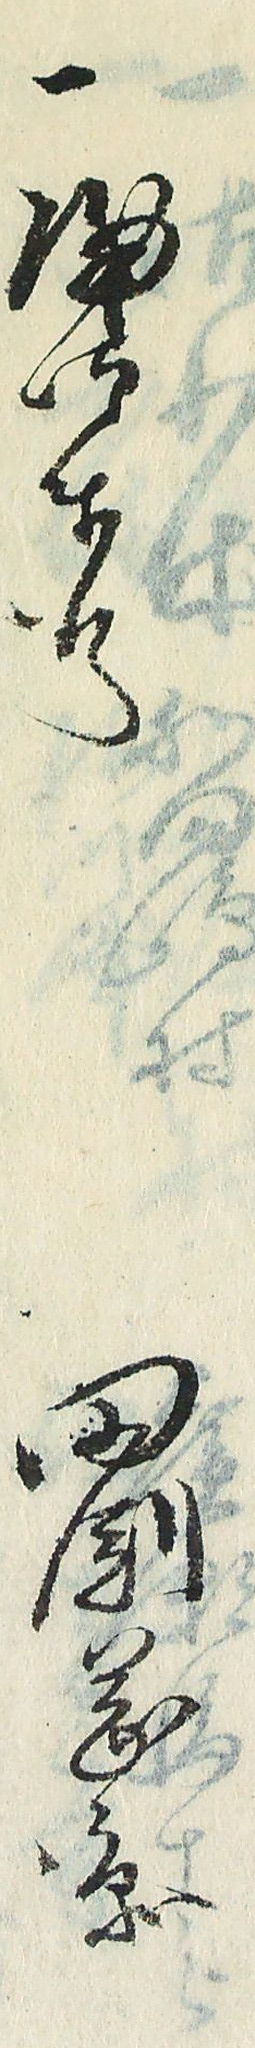一浦御奉行田淵甚兵衛
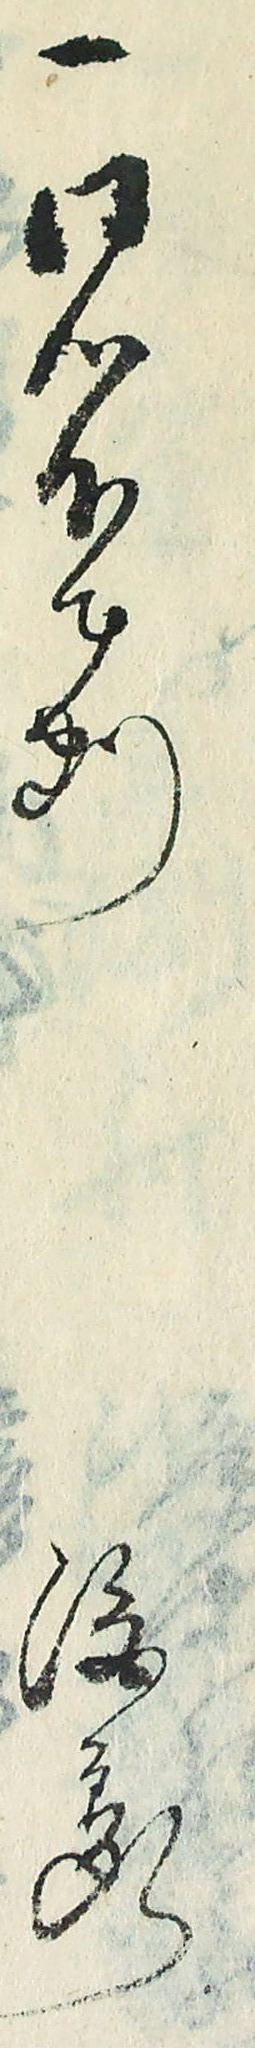一同心下才判儀兵衛
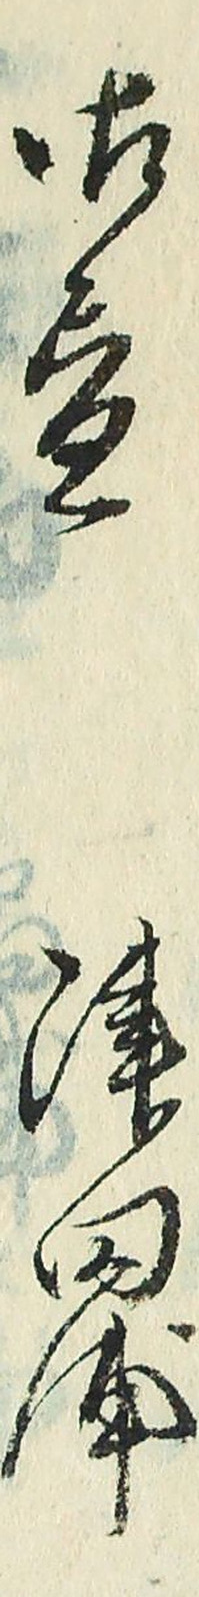御昼津田浦
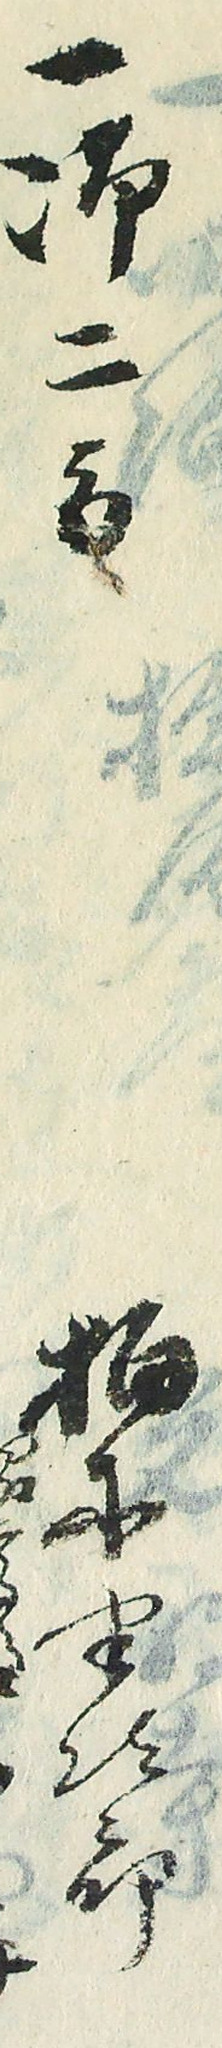一御二方柏木半次郎
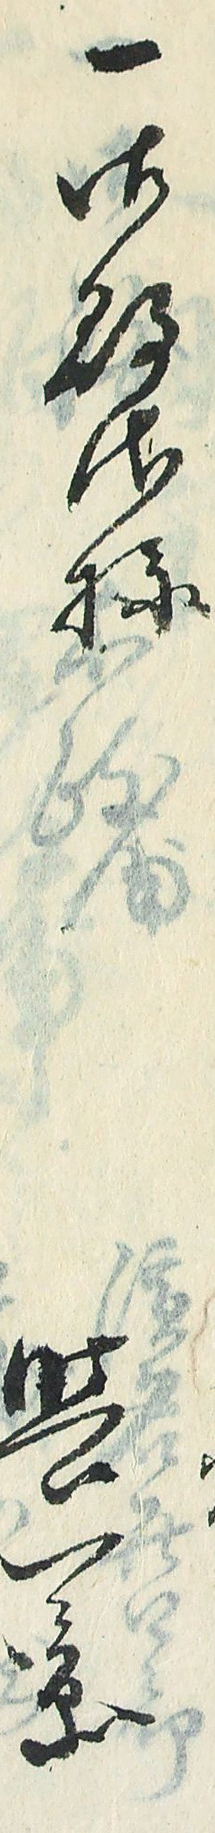一御郡代様与一兵衛

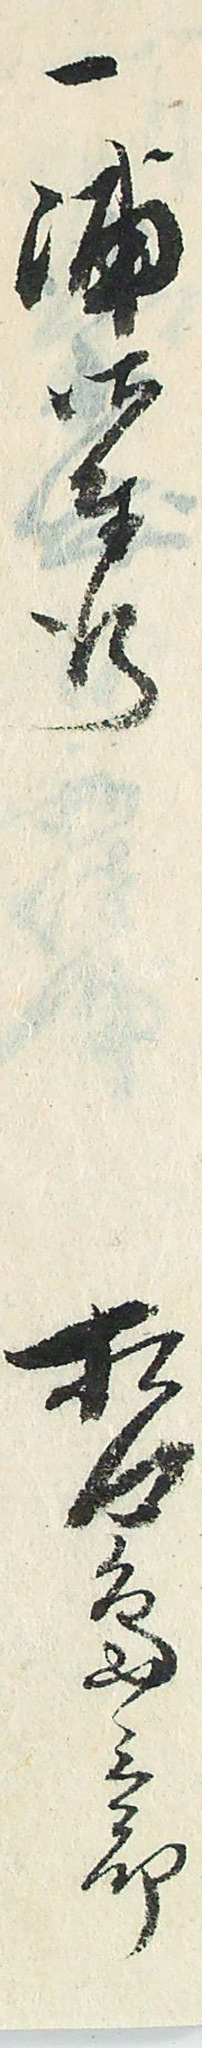一浦御奉行松江島三郎
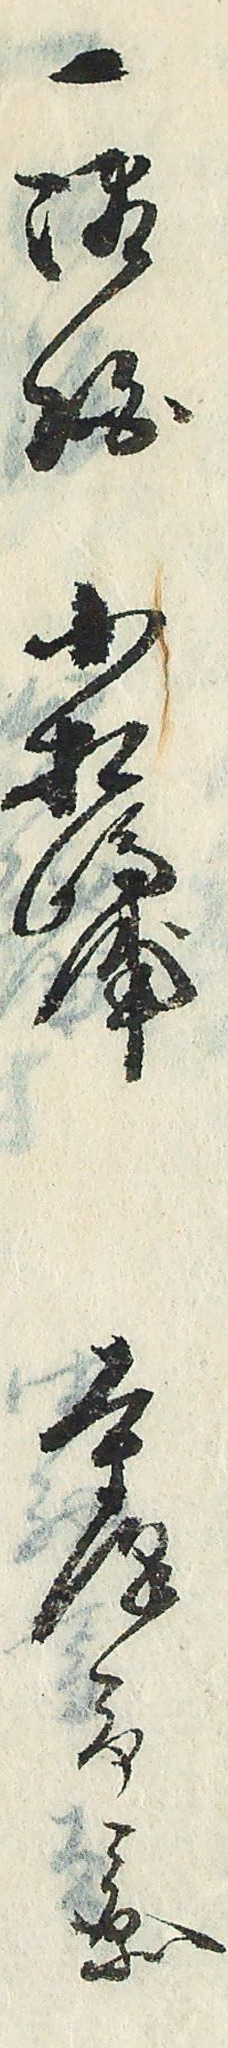一御泊小松島浦寺沢市兵衛
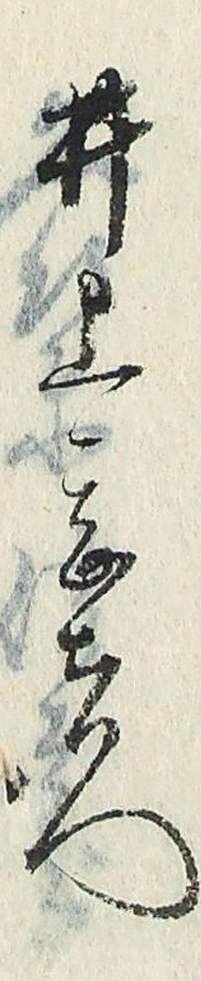同井上甚右衛門
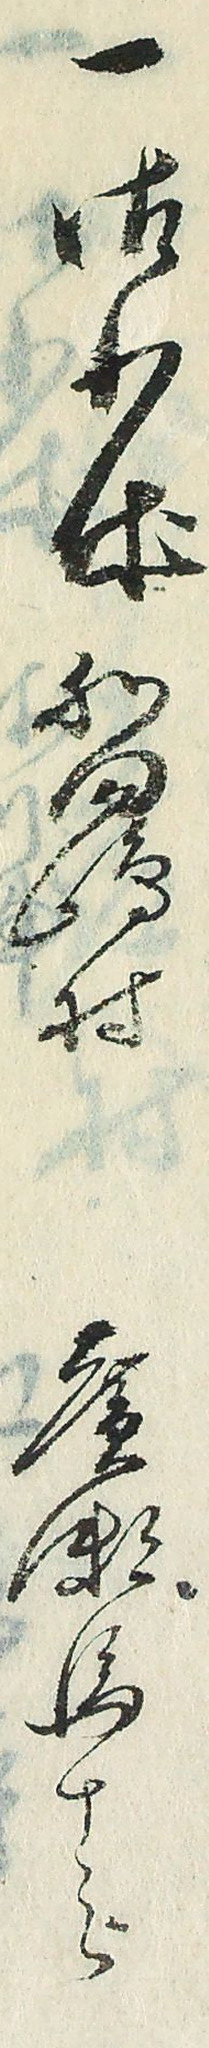一御小休和田島村広瀬馬十郎
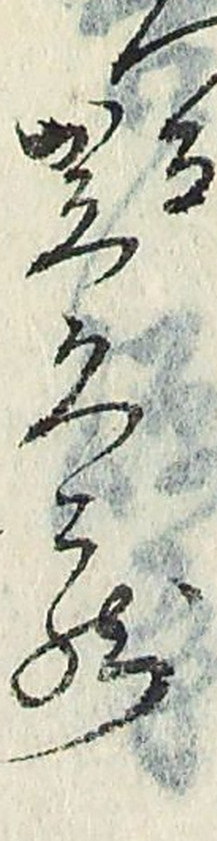賀久蔵
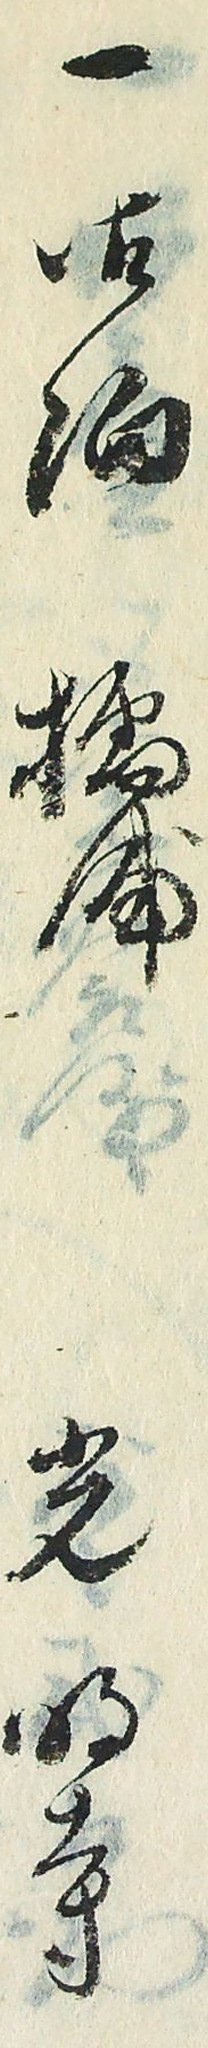一御泊橘浦光明寺
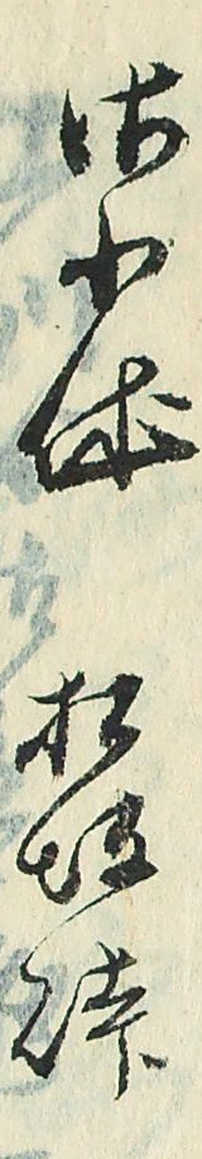御小休松坂峠
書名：公辺御役人為御廻浦御立越諸御用一巻
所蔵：鳴門教育大学 Naruto University of Education
